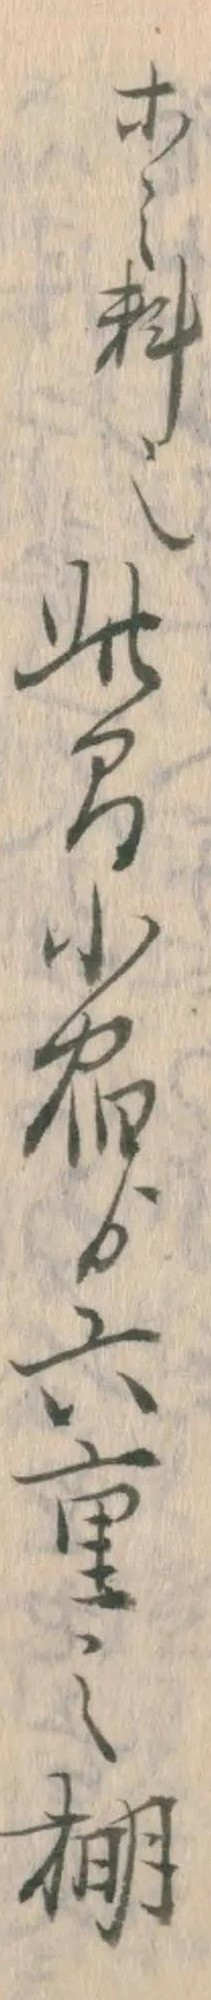等之料也此間小宿ゟ六重之棚
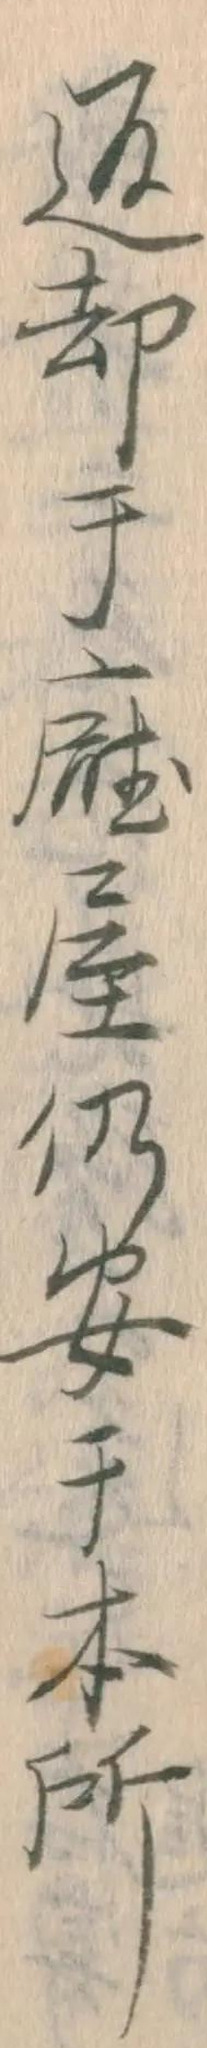返却于庁屋仍安于本所
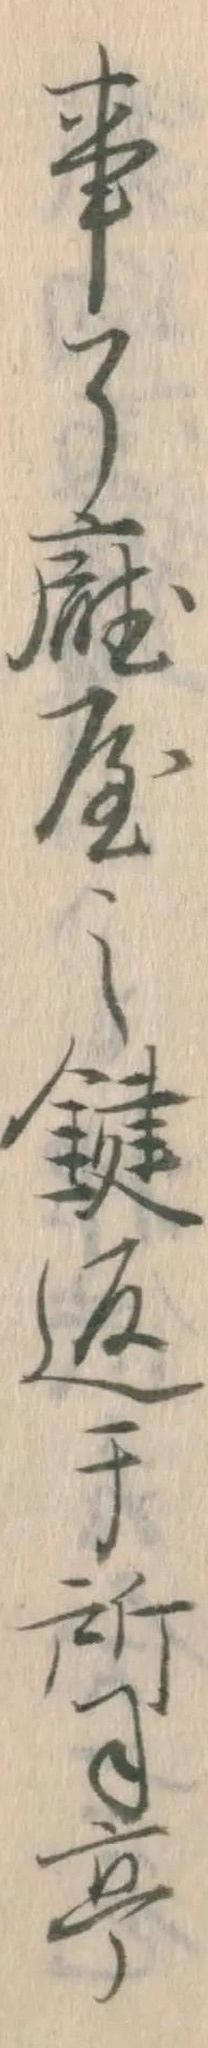事了庁屋之鍵返于所司亭
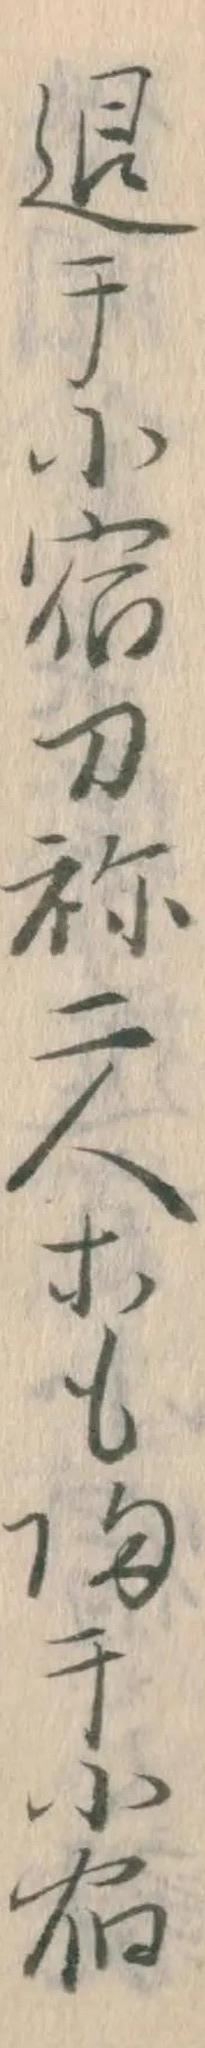退于小宿刀祢二人等も帰于小宿
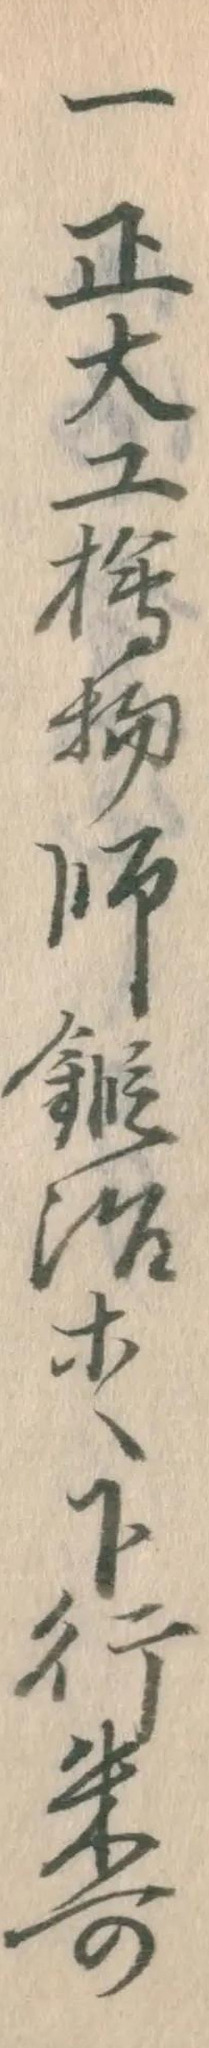一正大工檜物師鍛治等へ下行米可
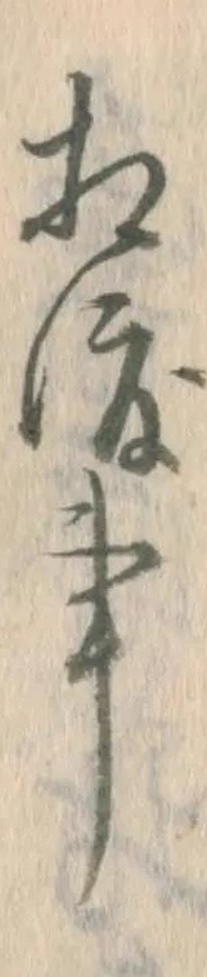相渡事
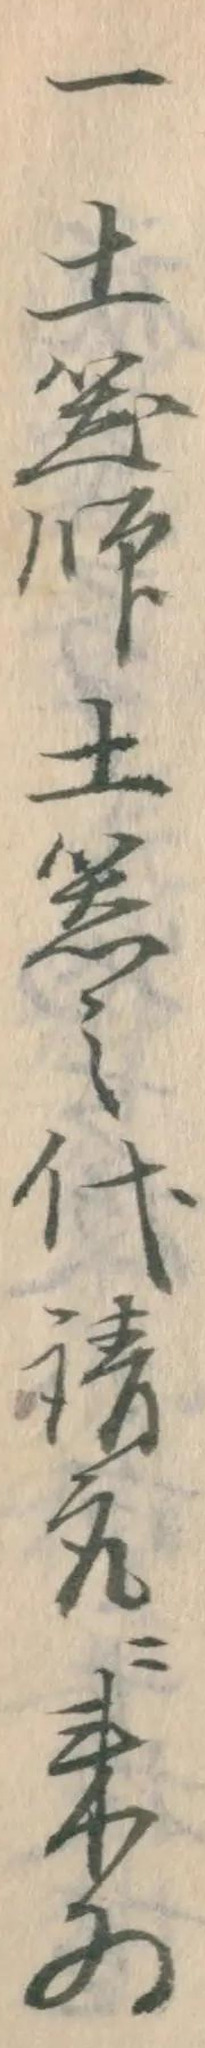一土器師土器之代請取に来為

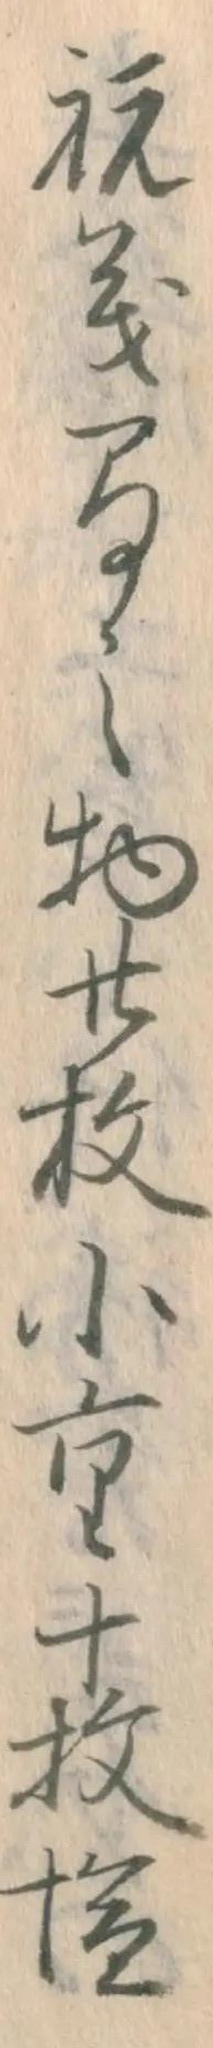祝義間之物廿枚小重十枚塩
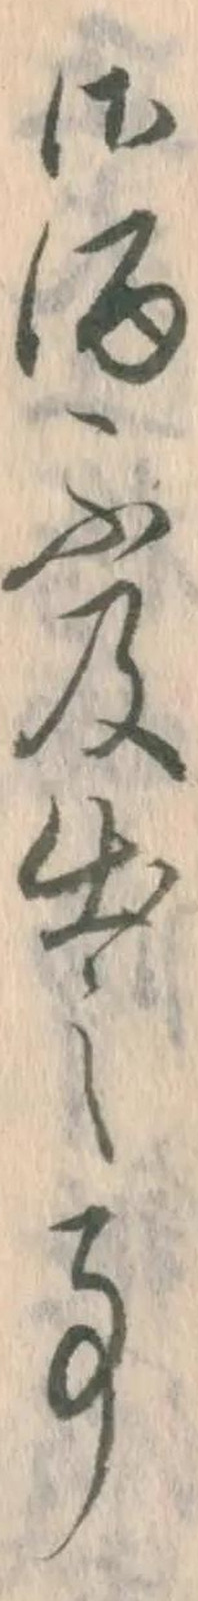御酒不及出之事
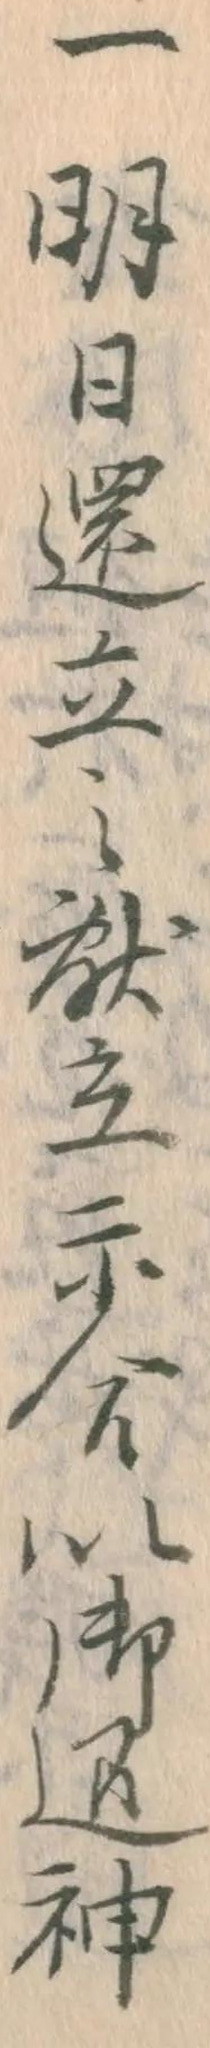一明日還立之献立示合以御退神
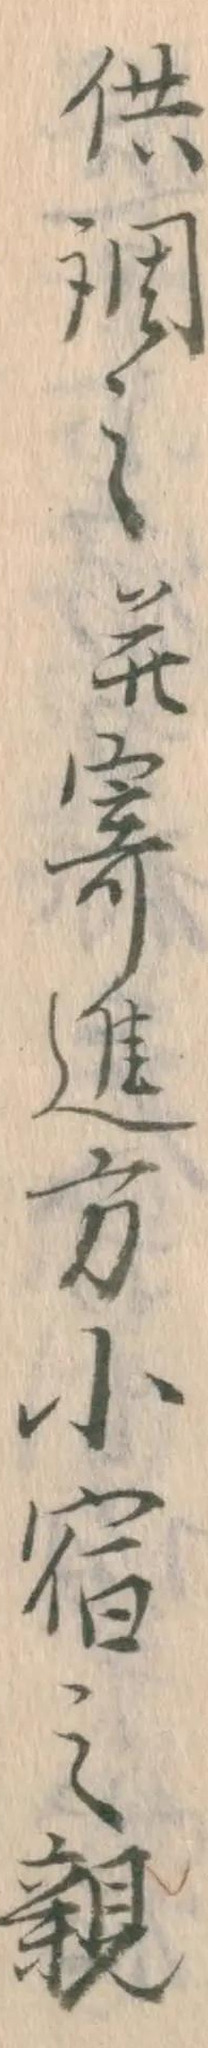供調之并寄進方小宿之親
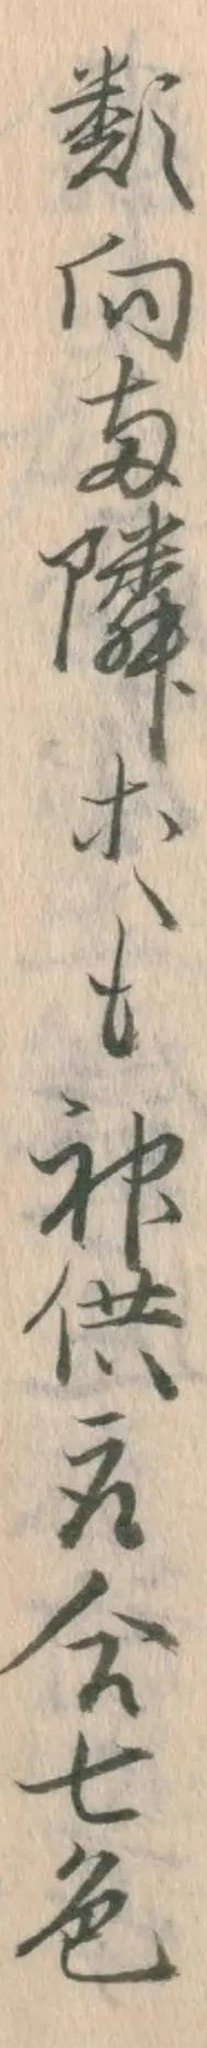類向両隣等へも神供取合七色
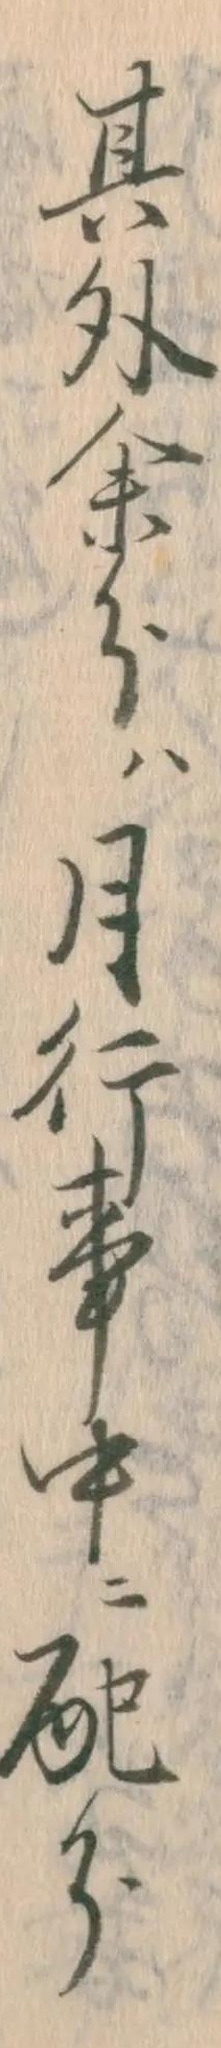其外余分は月行事中に配分
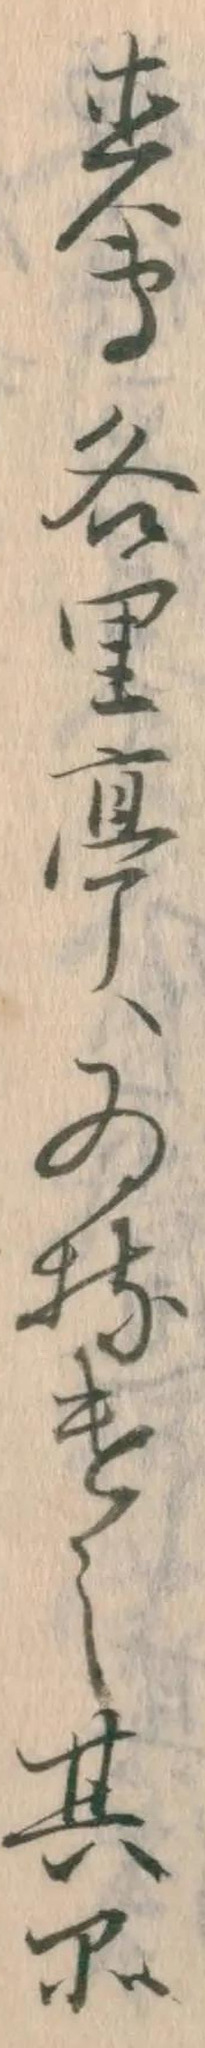直会各里亭へ為持遣之其品
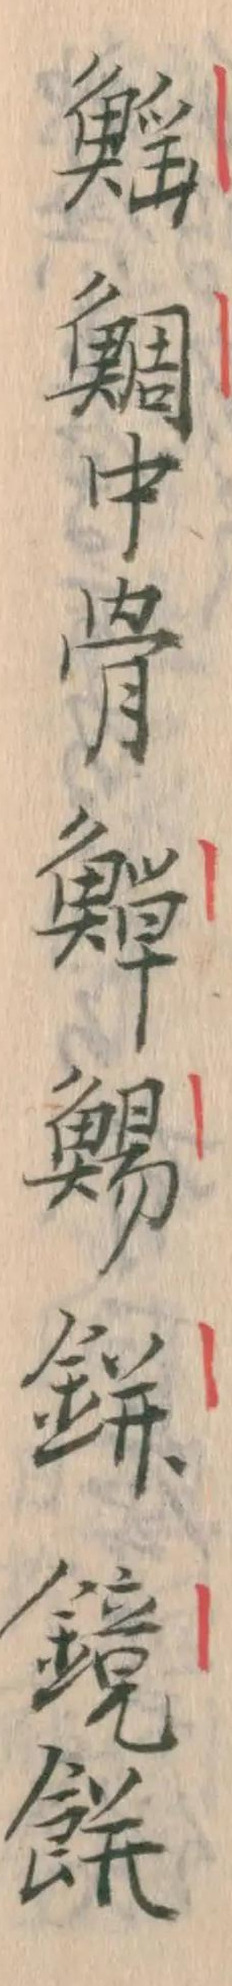鰩鯛中骨鱓鯣餅鏡餅
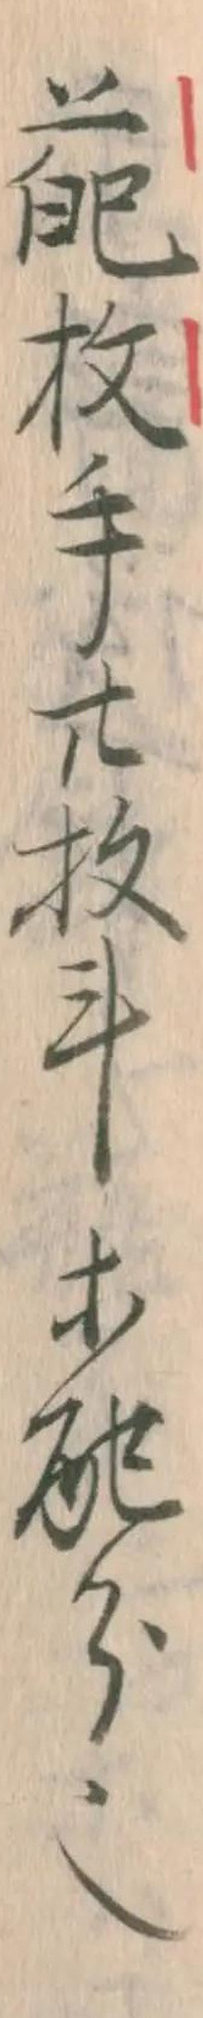葩枚手廿枚計等配分也
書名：賀茂社記録. 第81冊
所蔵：国立国会図書館 National Diet Library, JAPAN
